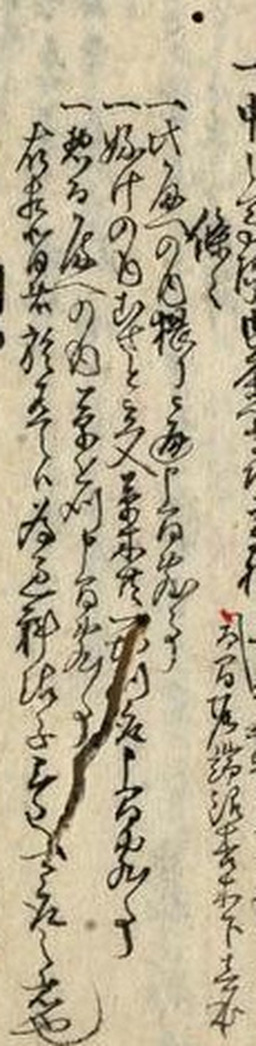一ふけの内むさと立入草木共一切刈取申間敷事
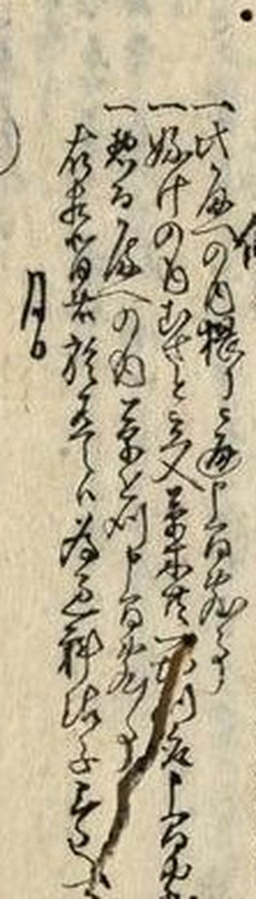一惣てかまへの内草を刈申間敷事
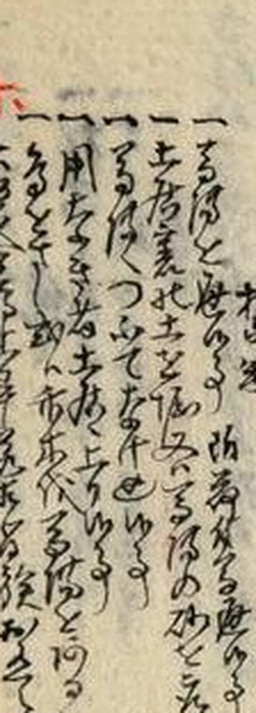一馬場へつふてなけ込候事
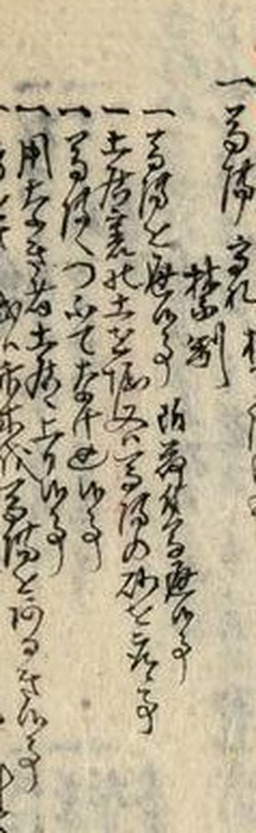一土居裏の土を掘又は馬場の砂を取候事
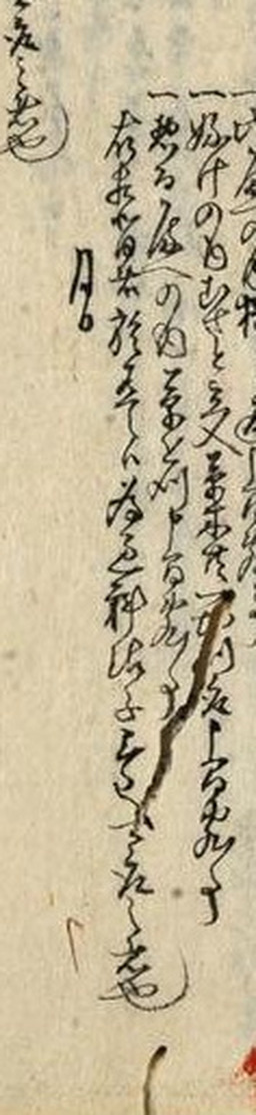右相背者於有之は為過料銀子三匁可取之者也
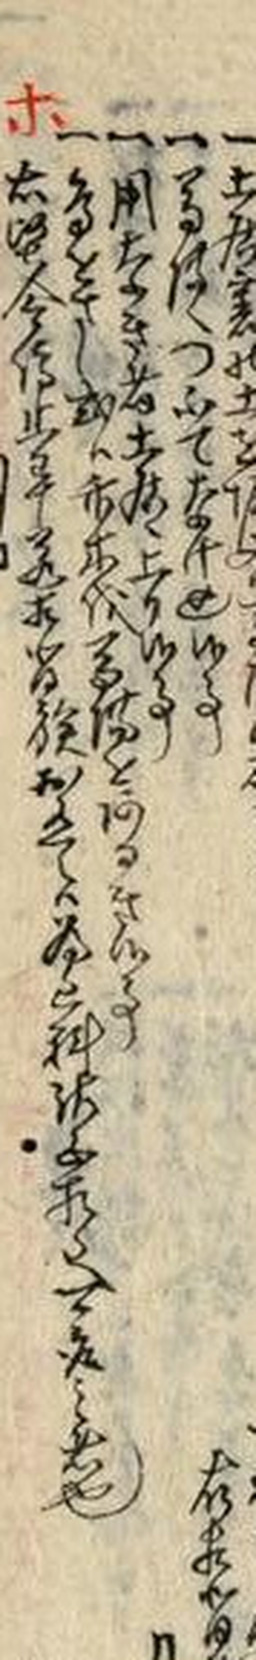右堅令停止畢若相背族於有之は為過料銀子拾匁可取之者也

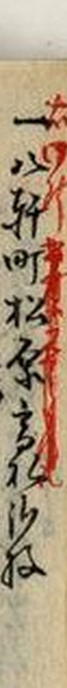一八軒町松原高札弐枚
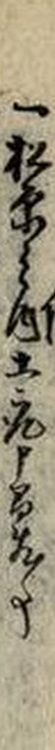一松原之内土取申間敷事
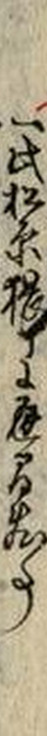一此松原猥りに通間敷事
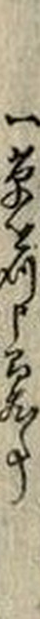一草を刈申間敷事
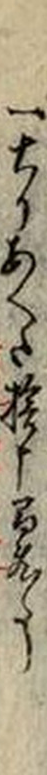一ちりあくた捨申間敷事
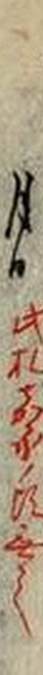月日此札嘉永ノ頃無之
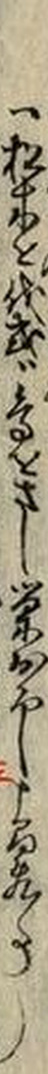一松木を伐或は鳥をさし巣おろし申間敷事
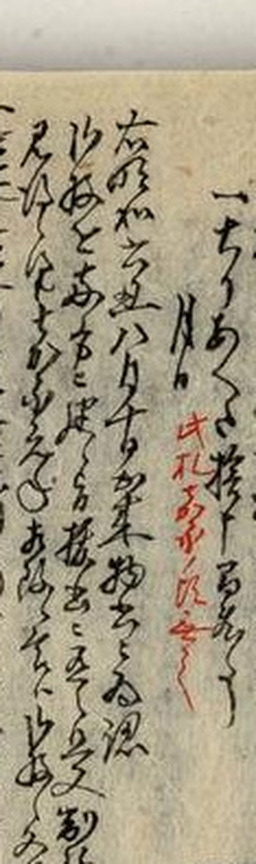右明和六丑八月十日加来物書に為認
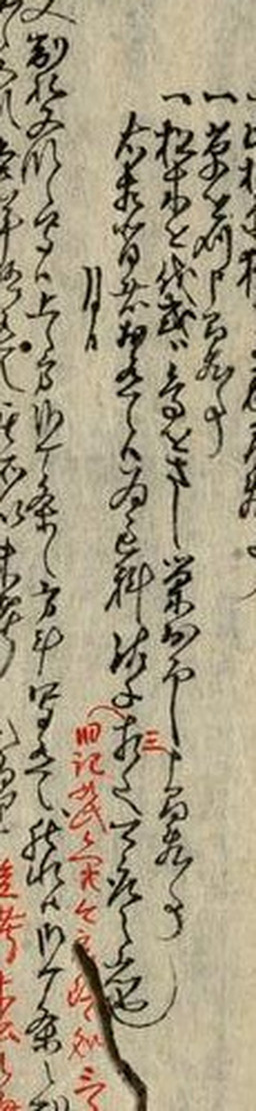右相背者於有之は為過料銀子拾匁可取之者也
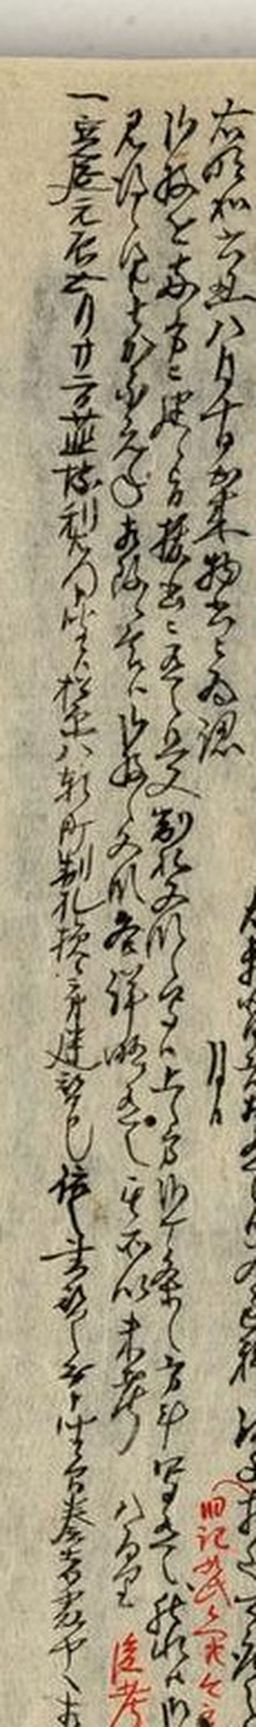見得候得共嘉永元年相改候節は弐枚之文段各詳略有之其所以未考八百里後考朱書之通
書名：御城下諸事之部
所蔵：福井県文書館 Fukui Prefectural Archives
